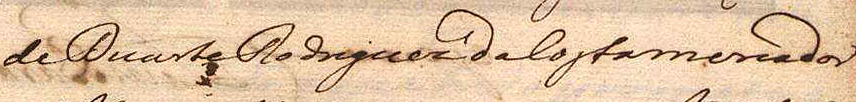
de Duarte Rodriguez da Costa mercador
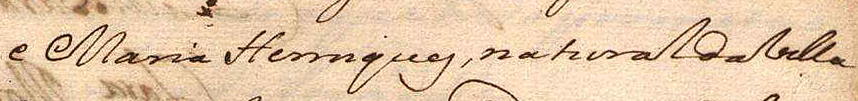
e Maria Henriques, natural da Villa
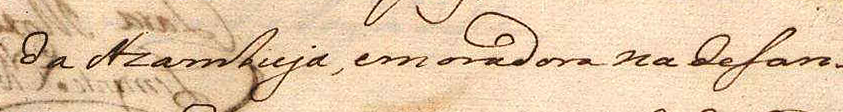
da Azambuja, e moradora na de san
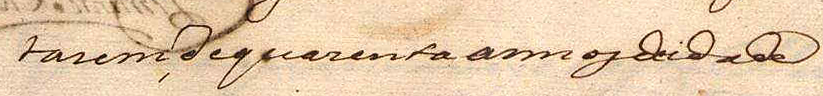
tarem, de quarenta annos de idade
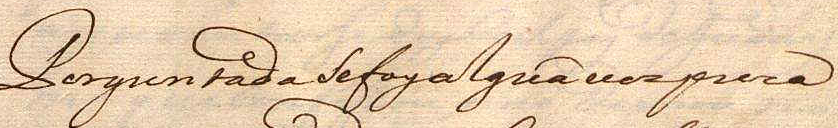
Perguntada se foy alguā uez preza
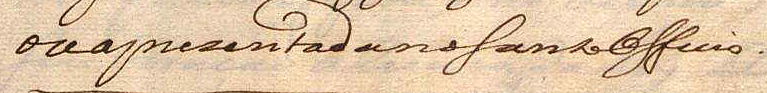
ou aprezentada no santo Officio.
